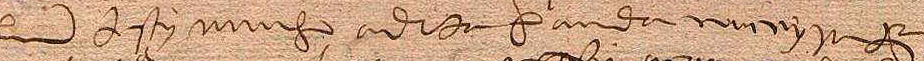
hū testymunho a dita bianda couceyra tsa
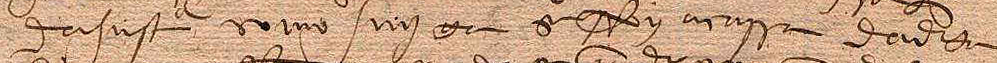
da Justa como Jmjga se ffoy a cassa da dita
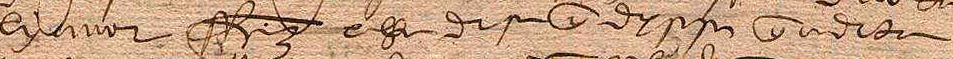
lyanor f̄frz e lhe dize q̄ dysese q̄ a dita
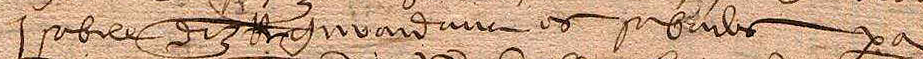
Jsabell d̄iz Re guoardaua os sabados ꝑa
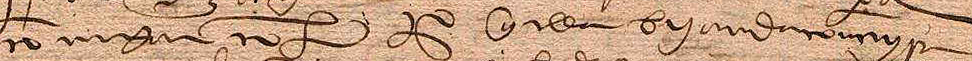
c̄ocertar c̄o hū tso q̄ ella brjanda couceyra
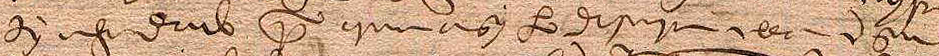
tynha dado p̄o que asy o disera ella ē seu
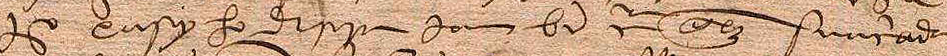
tso e asy ho disera tambē cra ḡlz sua ciada
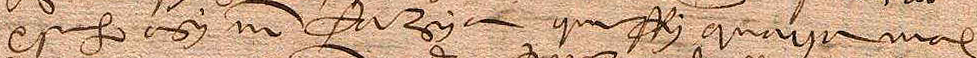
e se ho asy n̄o fazya que ffyquarja mal
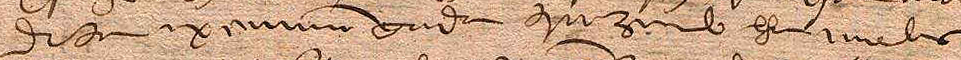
dita excumūgada trazendo lhe medos
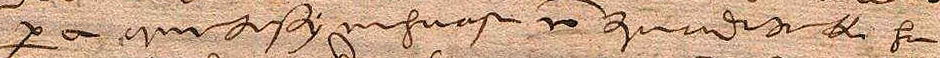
ꝑa que testymhuase c̄otra a dita Re ha
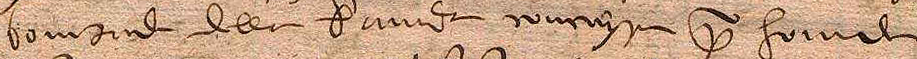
vomtade della bianda couceyra p̄o homde
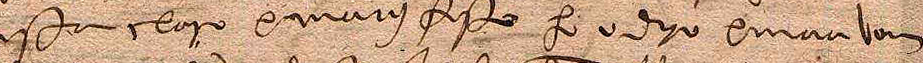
esta claro e manjfesto ho odyo e maa vom
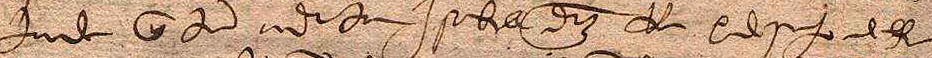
tade q̄ tē a dita Jsabel d̄iz Re e deseJo de lhe
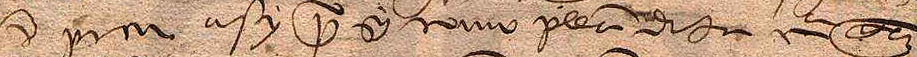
ēpeçer asy p̄o sy como pllā dita ca ḡlz
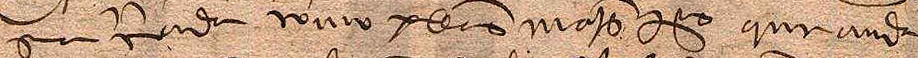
sua ciada como pllās majs tsas que anda
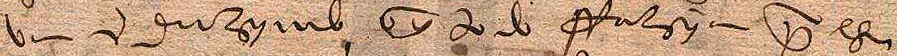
va ēduzyndo o q̄ todo ffazya p̄o lhe
